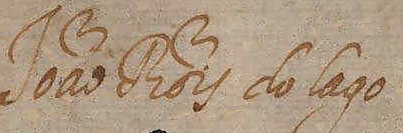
Ioaõ Rōis do lago
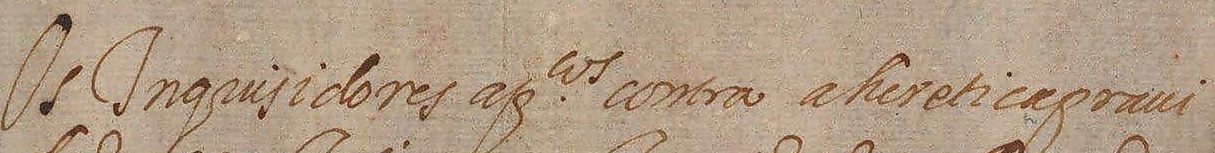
Os Inquisidores ap.cos contra a heretica praui
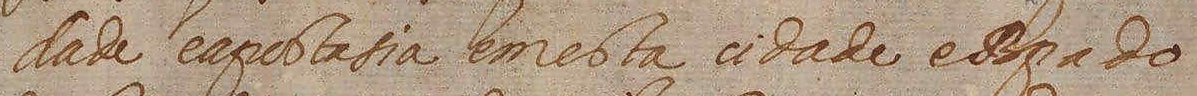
dade e apostasia em esta cidade e Bpado
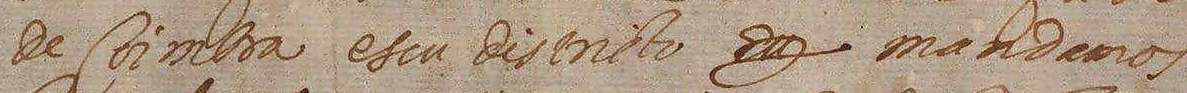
de Coimbra e seu districto etc mandamos
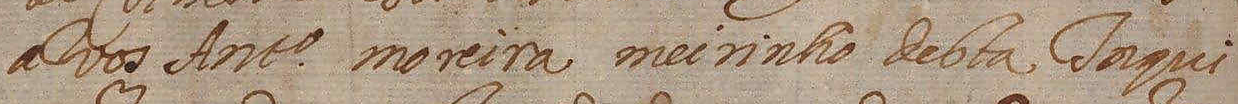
a vos Ant.o moreira meirinho desta Inqui
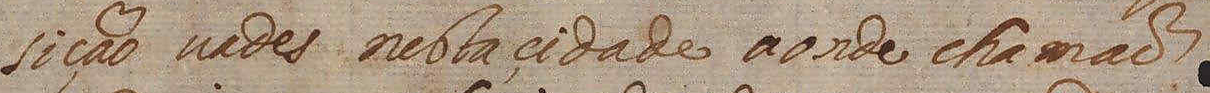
sição uades nesta cidade aonde chamaõ
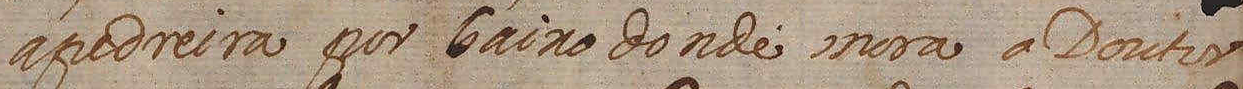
a pedreira por baixo donde mora o Doutor
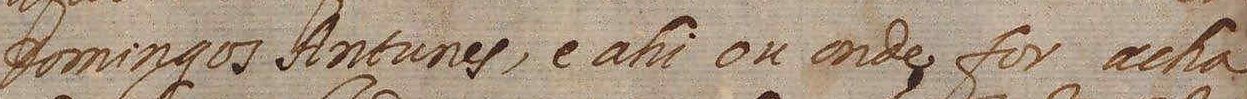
Domingos Antunes, e ahi ou onde for acha
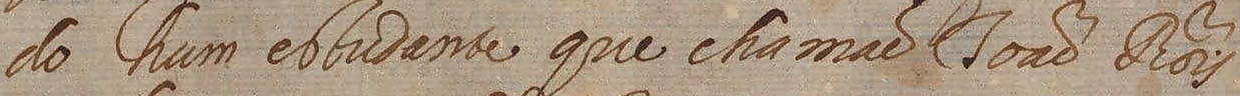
do hum estudante que chamaõ Ioaõ Rōiz
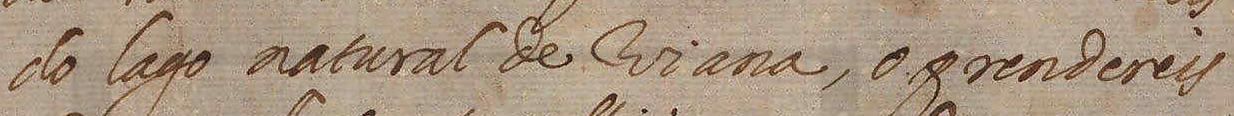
do lago natural de Viana, o prendereis
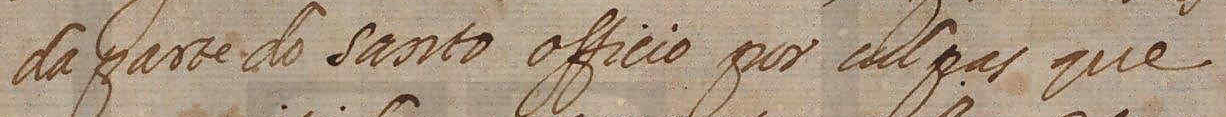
da parte do Santo officio por culpas que
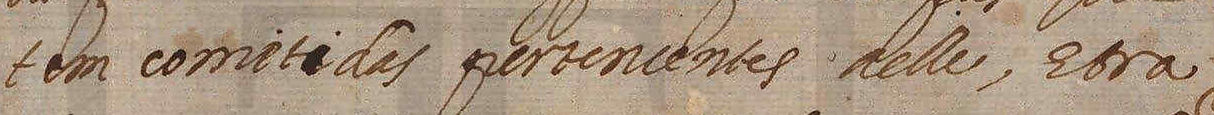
tem comitidas pertencentes a elle, E tra
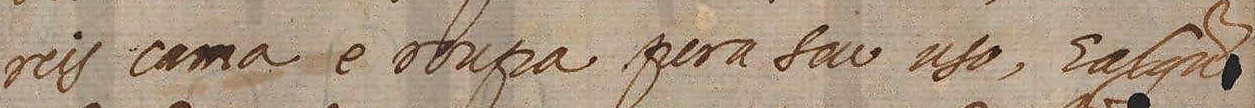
reis cama e roupa pera seu uso, E algū
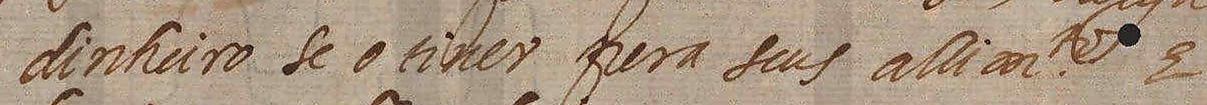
dinheiro se o tiuer pera seus allim.tos E
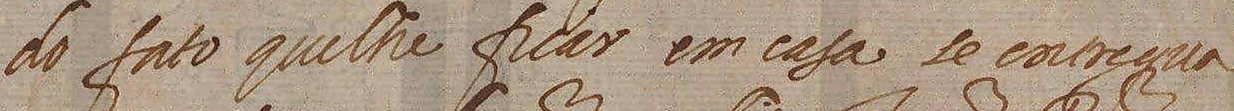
do fato que lhe ficar em casa se entregua
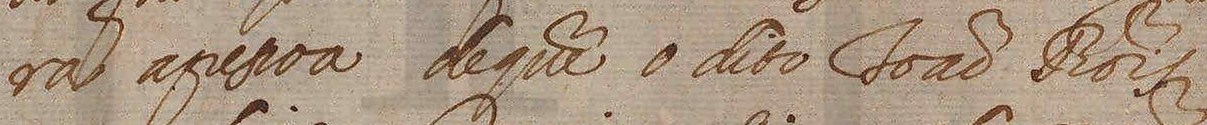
raõ a pessoa, de quē o dito Ioaõ Rōiz
